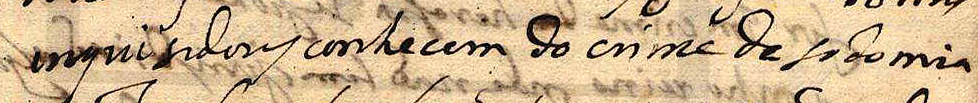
inquisidores conhecem do crime de sodomia
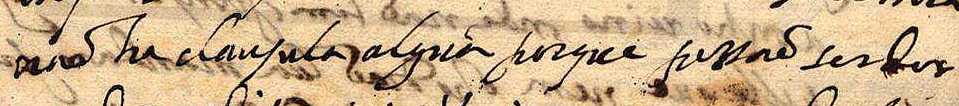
naõ ha causula alguā porque possaõ ser der
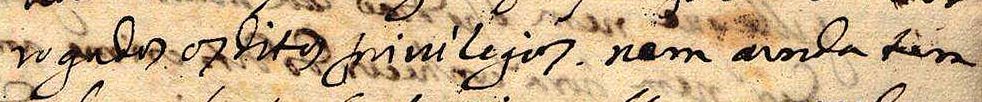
rogados os ditos priuilegios nem ainda tera
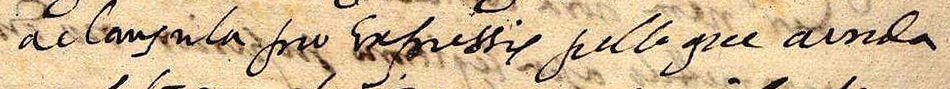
a clausula pro Expressis pello que ainda
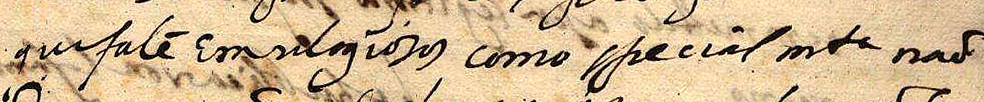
que falē Em religiozos como specialm.te naõ
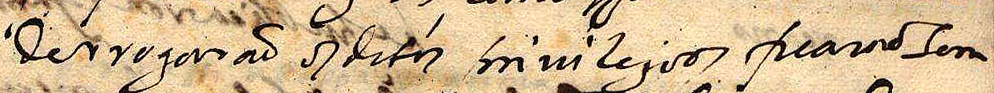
derrogaraõ os ditos priuilegios ficaraõ sem
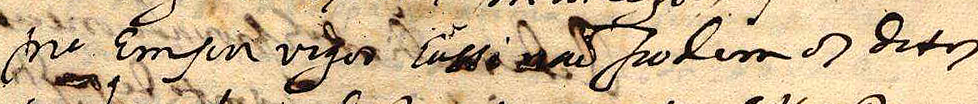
pre Em seu vigor E assi naõ podem os ditos
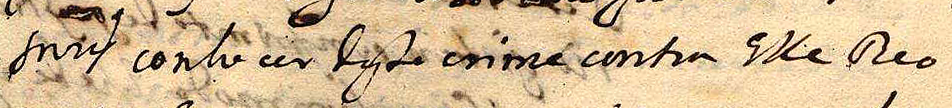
snres̄ conhecer deste crime contra Elle Reo
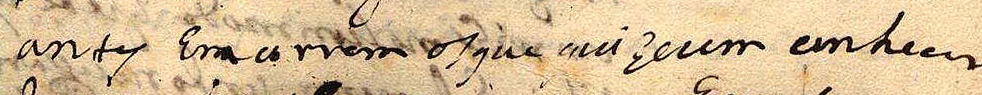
antes Emcorrem os que quizerem conhecer
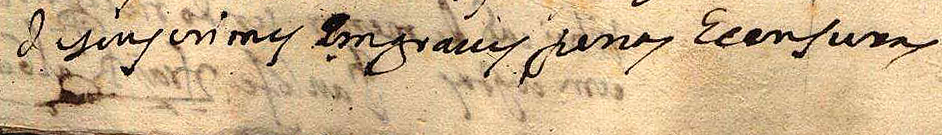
de seus crimes Em graues penas E censuras
